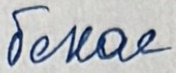бекас
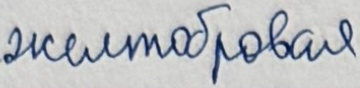желтобровая
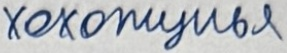хохотунья
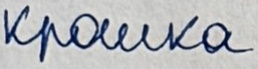крошка
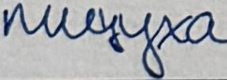пищуха
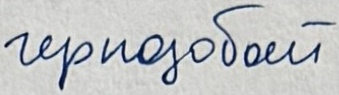чернозобый
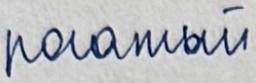рогатый
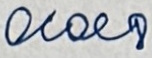осоед
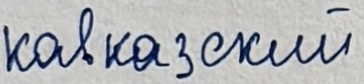кавказский
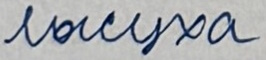лысуха
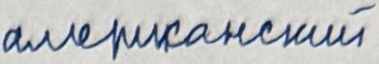американский
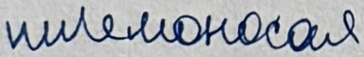шлемоносая
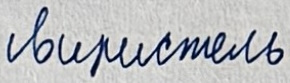свиристель
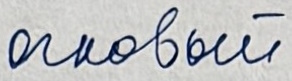очковый
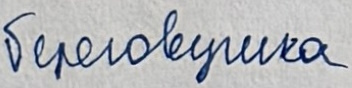береговушка
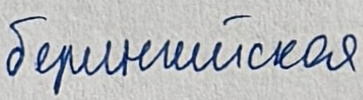берингийская
